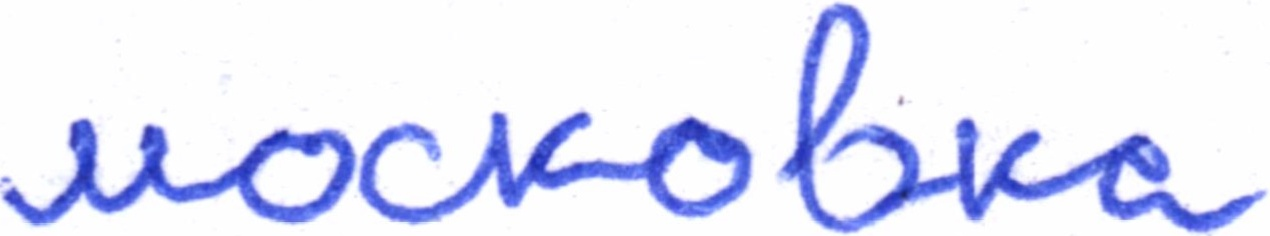московка
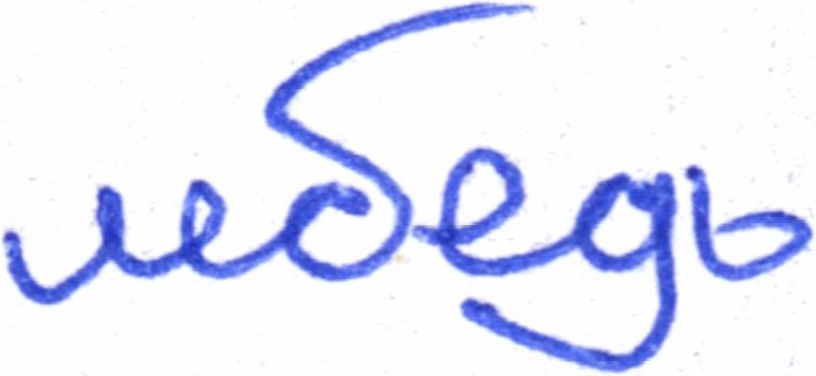лебедь
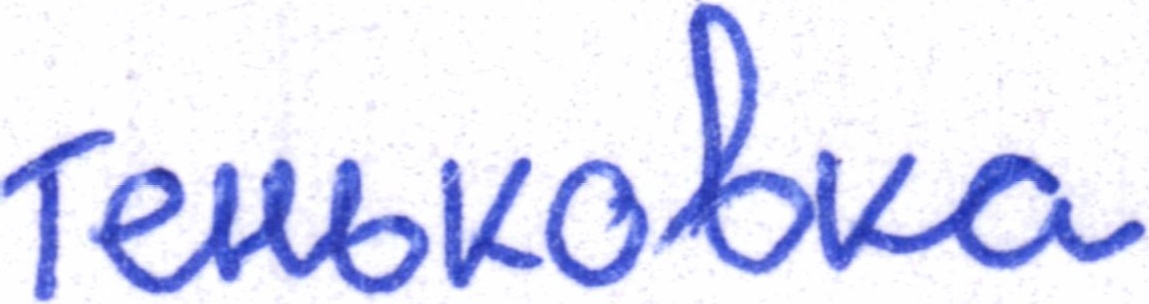теньковка
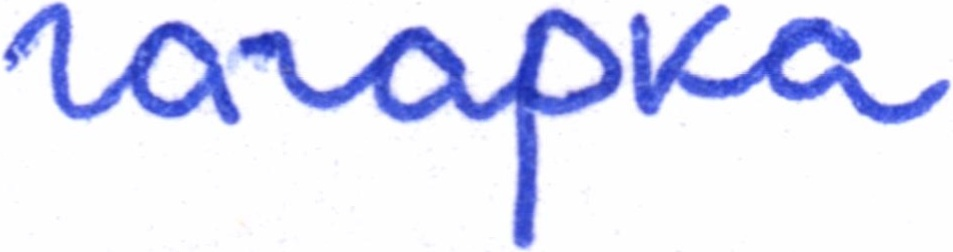гагарка
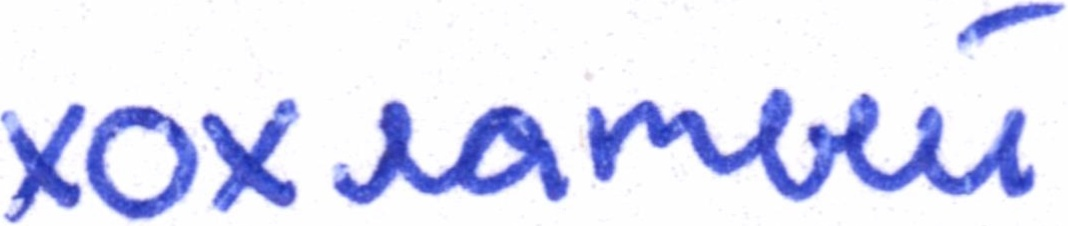хохлатый
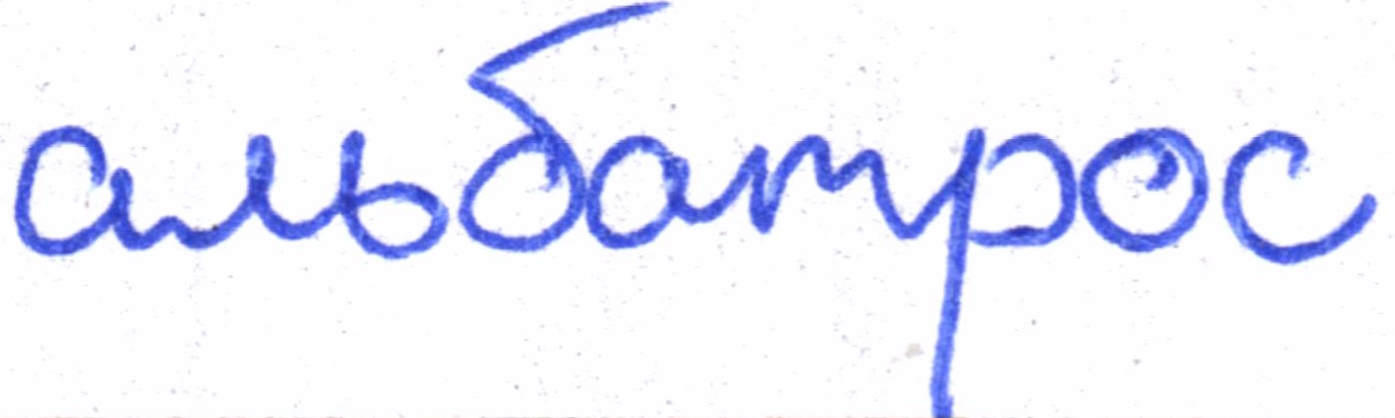альбатрос
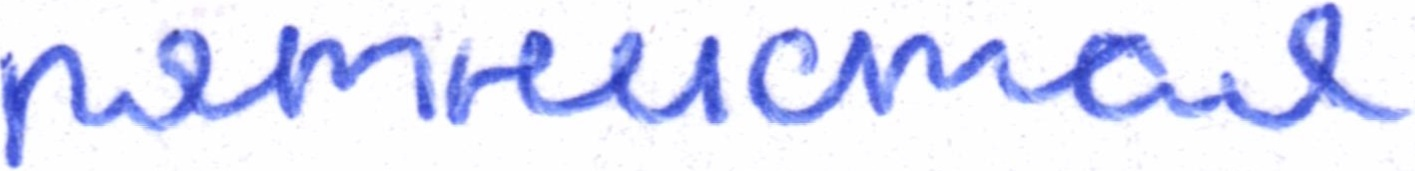пятнистая
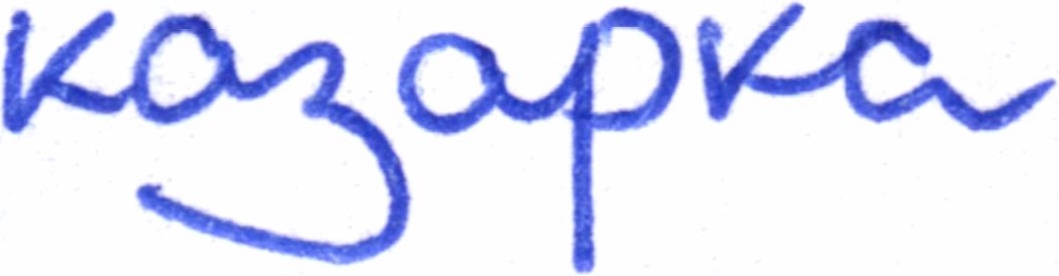казарка
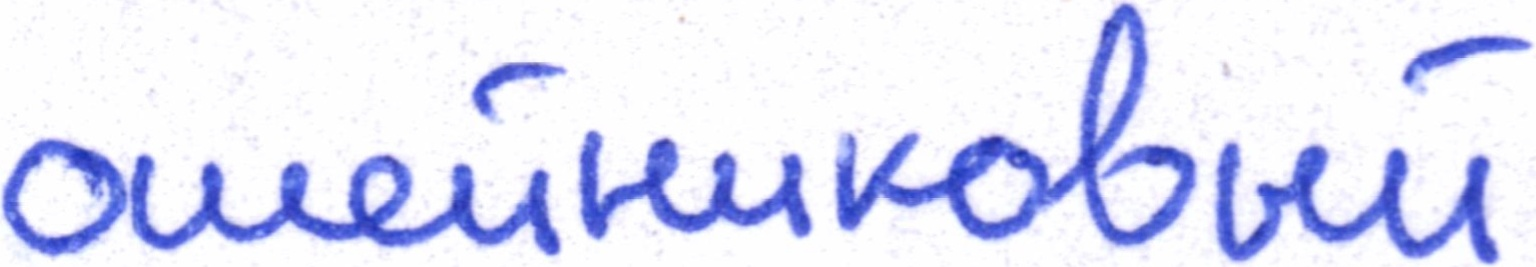ошейниковый
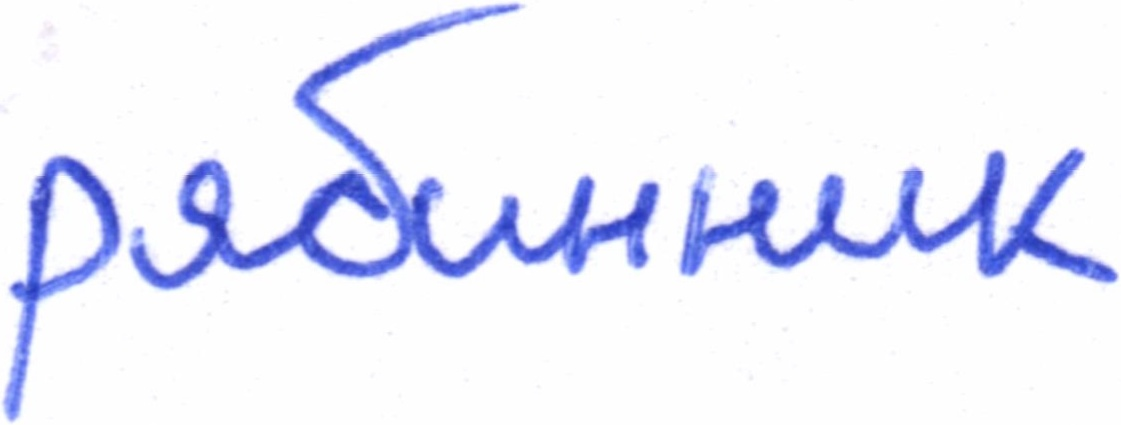рябинник
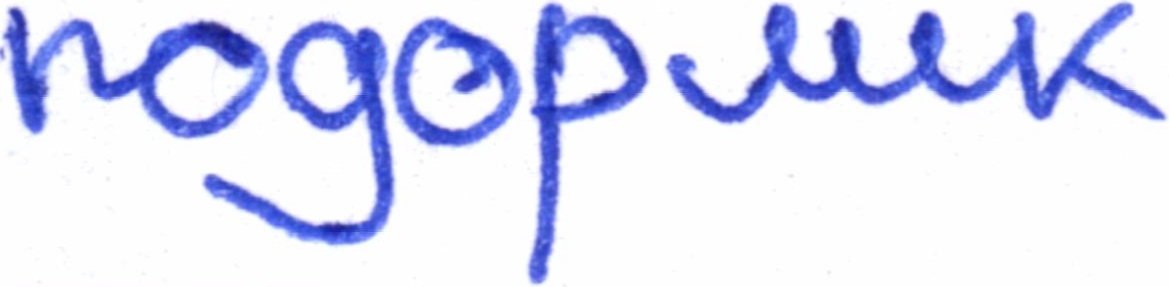подорлик
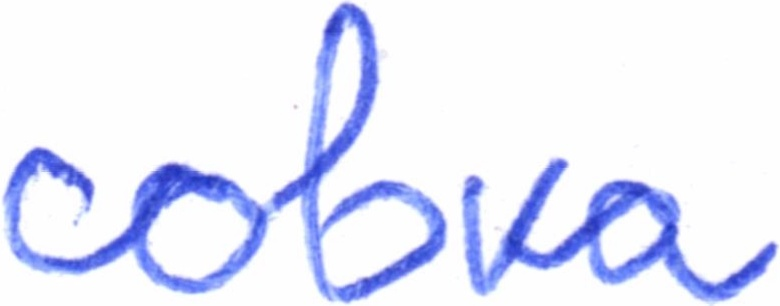совка
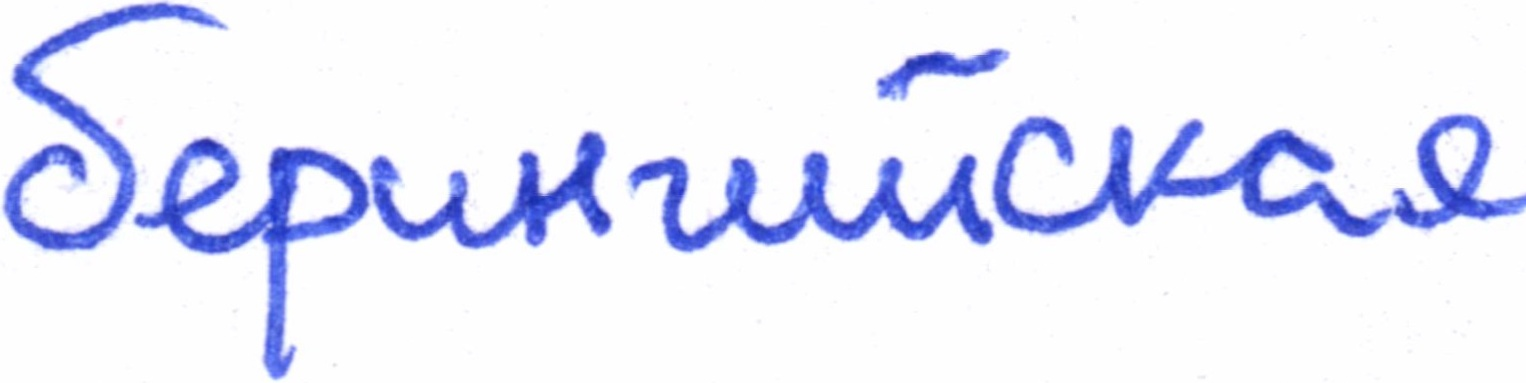берингийская
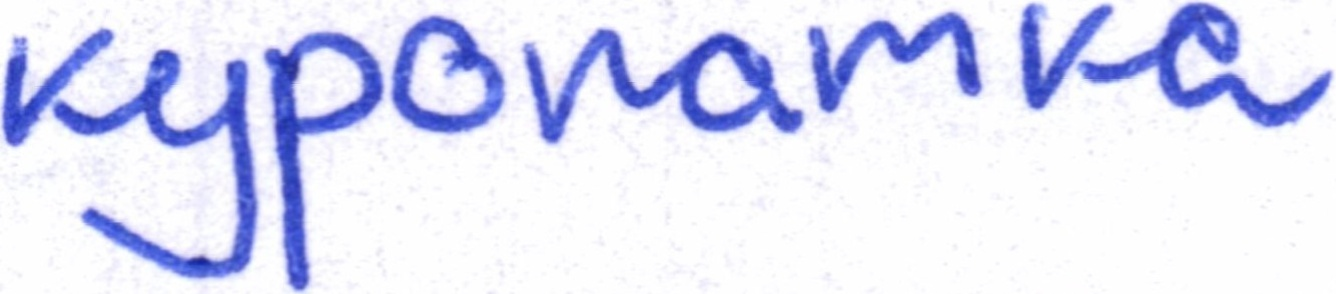куропатка
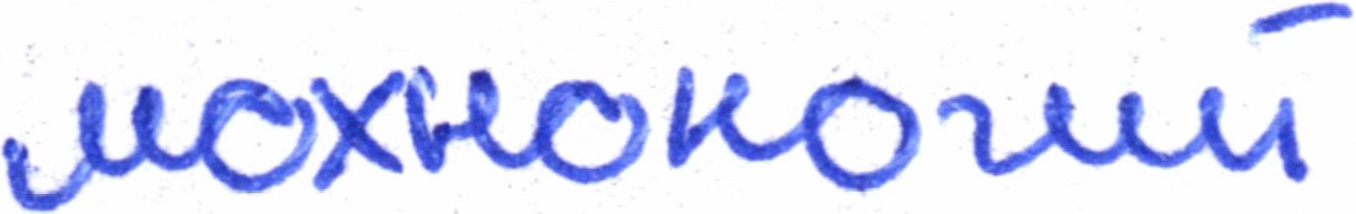мохноногий
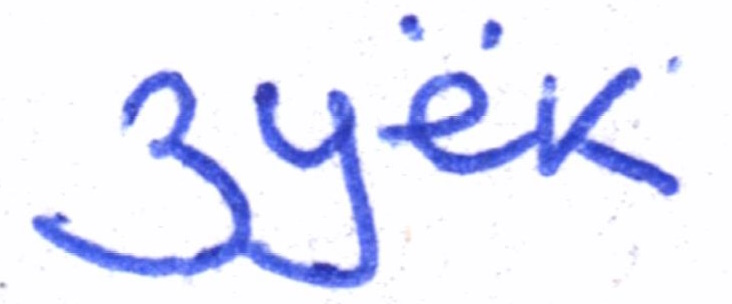зуёк
